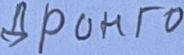дронго
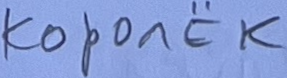королёк
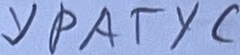урагус
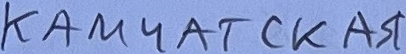камчатская
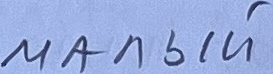малый
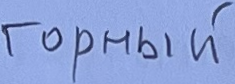горный
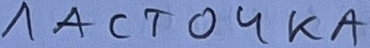ласточка
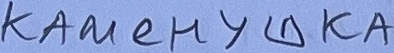каменушка
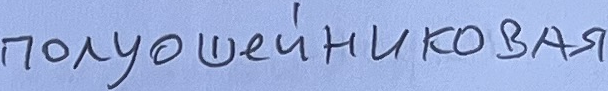полуошейниковая
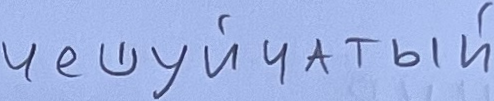чешуйчатый
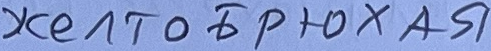желтобрюхая
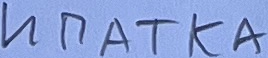ипатка
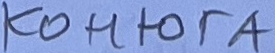конюга
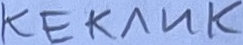кеклик
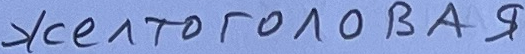желтоголовая
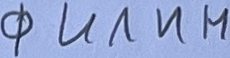филин
